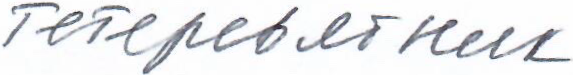тетеревятник
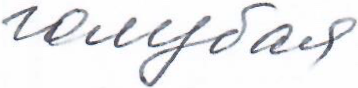голубая
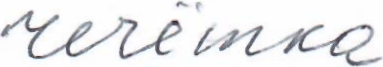чечётка
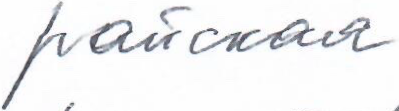райская
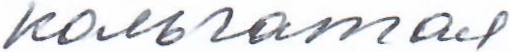кольчатая
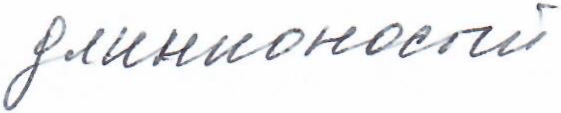длинноносый
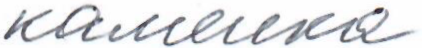каменка
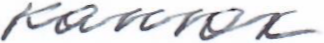канюк
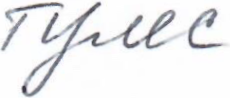тулес
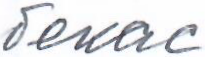бекас
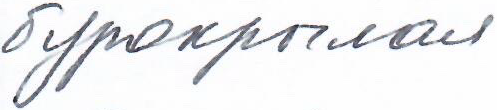бурокрылая
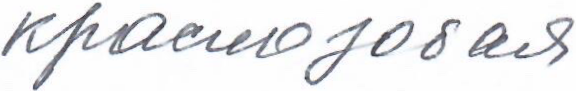краснозобая
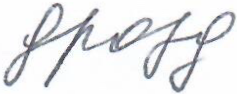дрозд
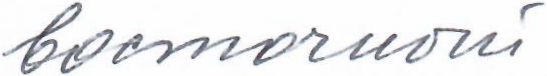восточный
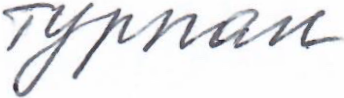турпан
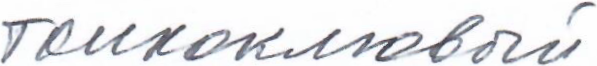тонкоклювый
